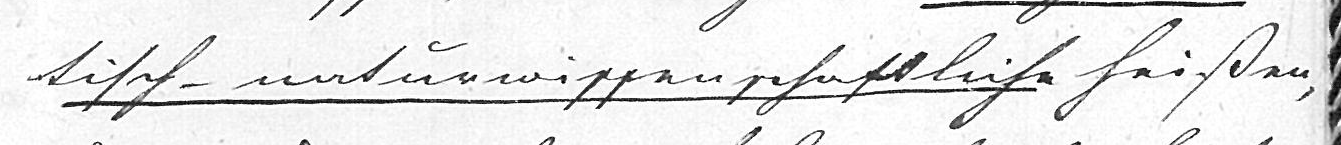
tisch-naturwissenschaftliche heißen,
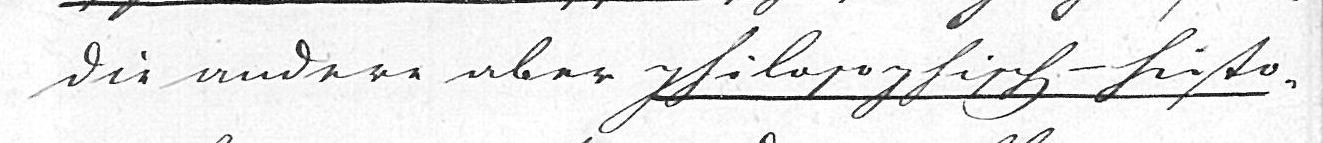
die andere aber philosophisch-histo-
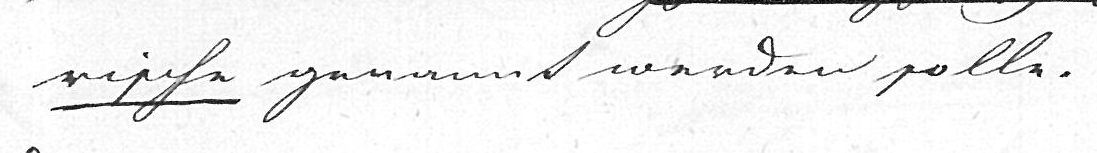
rische genannt werden solle.
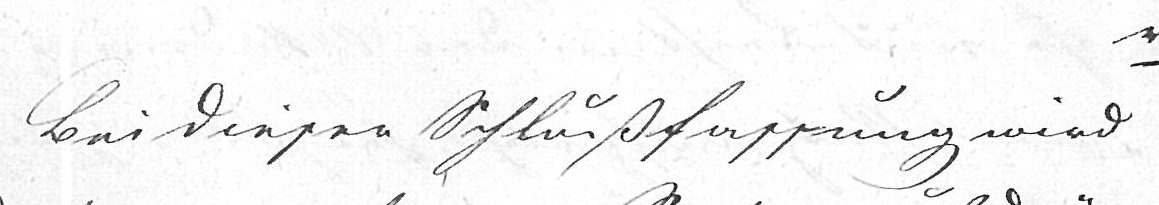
Bei dieser Schlußfassung wird
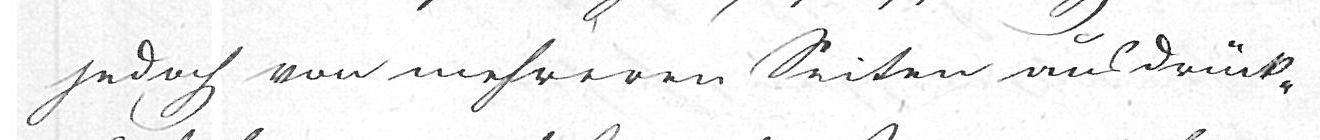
jedoch von mehreren Seiten ausdrück-
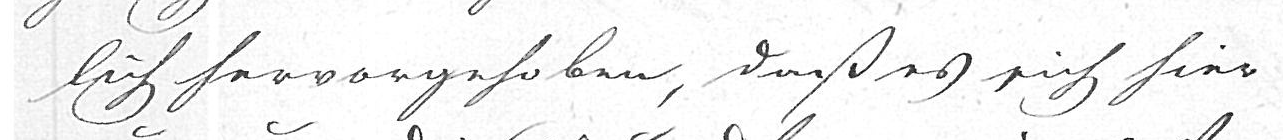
lich hervorgehoben, daß es sich hier
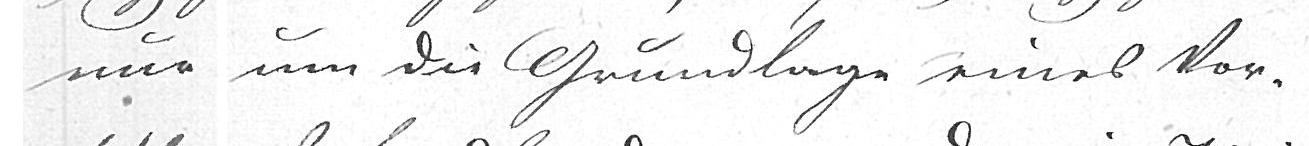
nur um die Grundlage eines Vor-
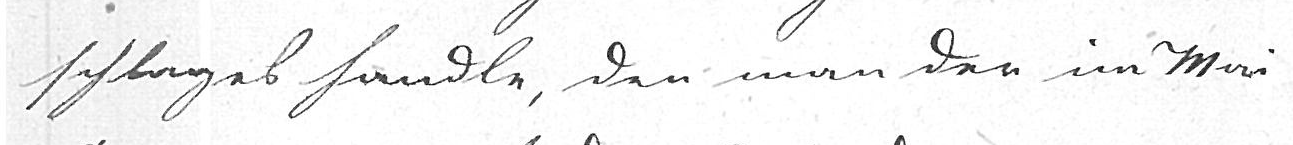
schlages handle, den man der im Mai
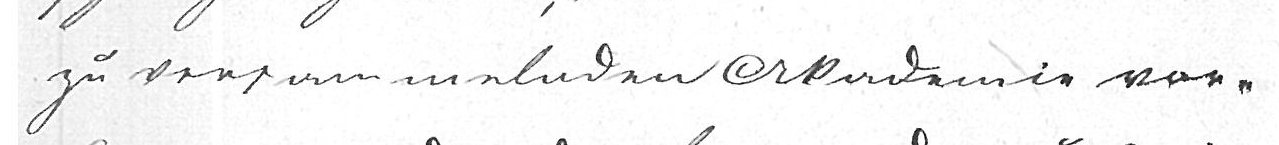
zu versammelnden Akademie vor-
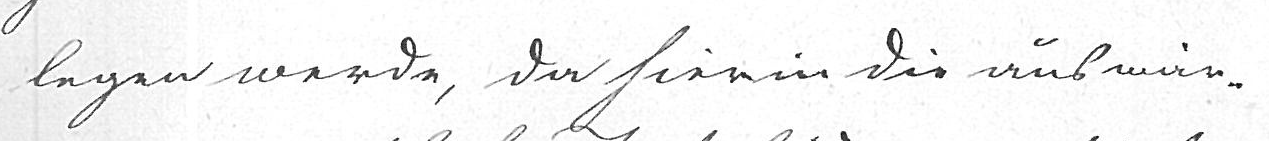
legen werde, da hierin die auswär-
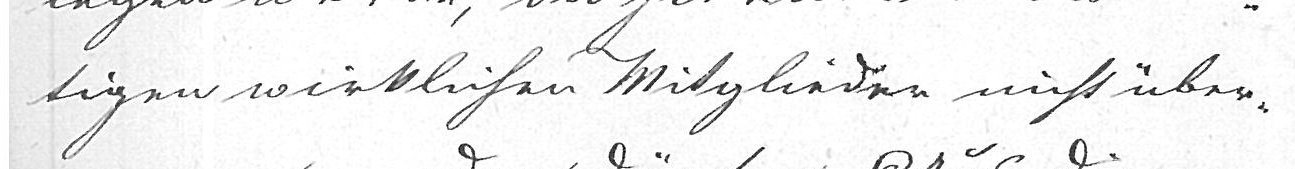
tigen wirklichen Mitglieder nicht über
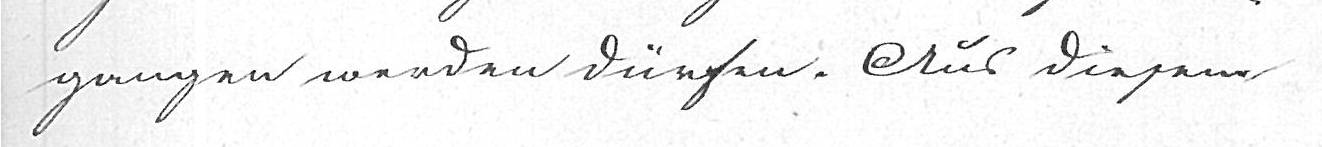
gangen werden dürfen. Aus diesem
